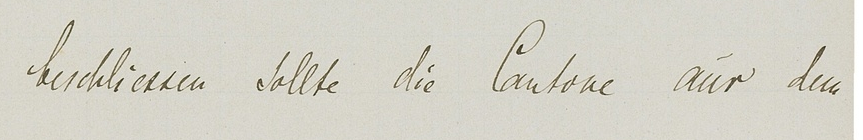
beschliessen sollte die Cantone aus dem
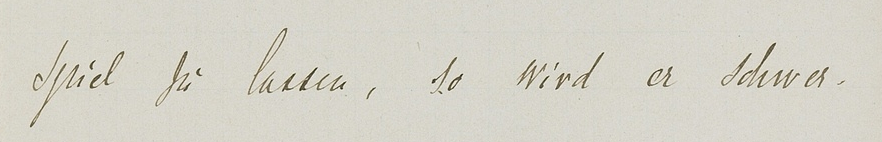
Spiel zu lassen, so wird er schwer-
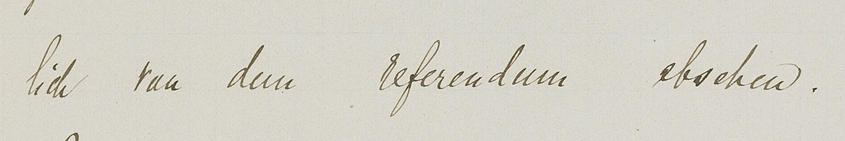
lich von dem Referendum absehen.
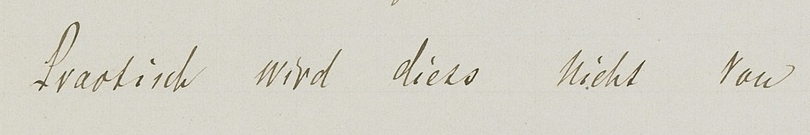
Practisch wird diess nicht von
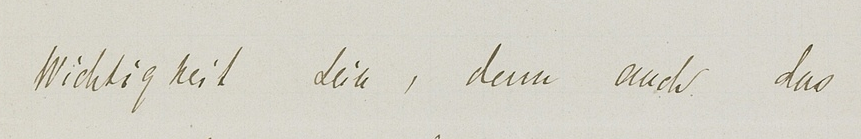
Wichtigkeit sein, denn auch das
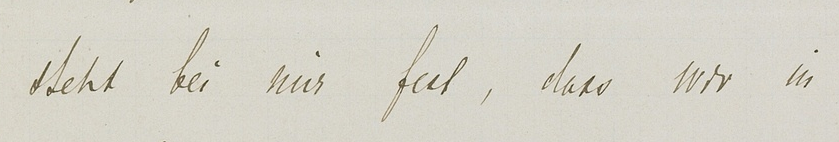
steht bei mir fest, dass wir in
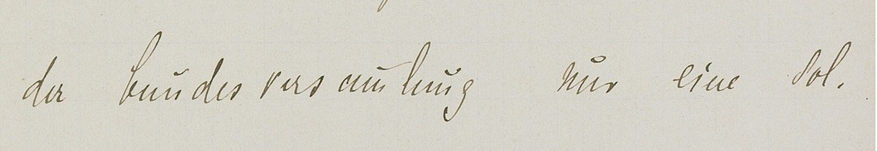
der Bundesversammlung nur eine sol-
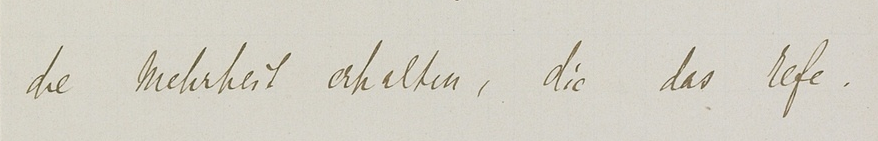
che Mehrheit erhalten, die das Refe-
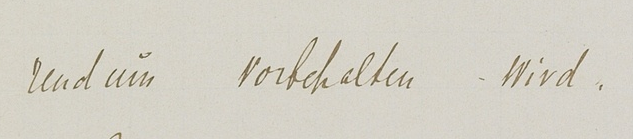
rendum vorbehalten wird.
